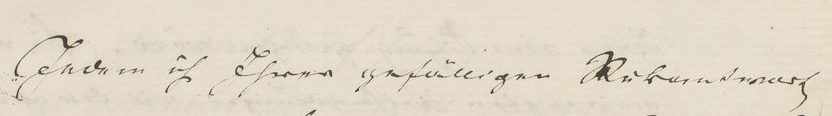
Indem ich Ihrer gefälligen Rükantwort
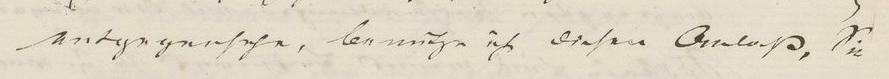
entgegensehe, benütze ich diesen Anlaß, Sie
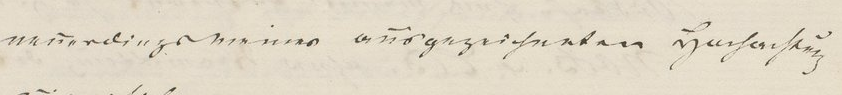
neuerdings meiner ausgezeichneten Hochachtung
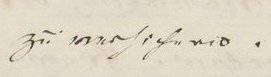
zu versichern.
